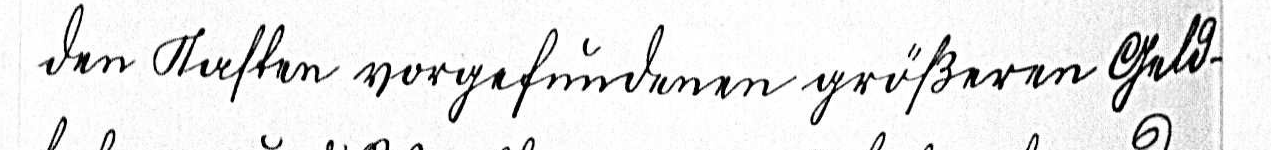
Kasten vorgefundenen größeren Geld¬
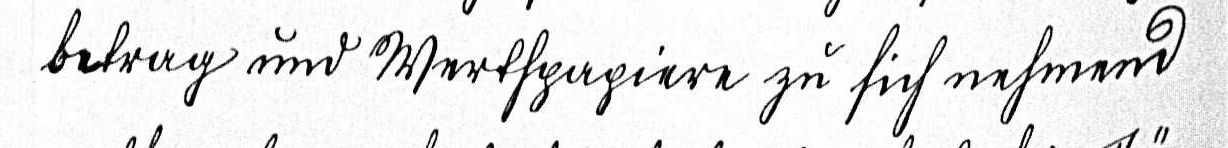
betrag und Werthpapiere zu sich nehmend
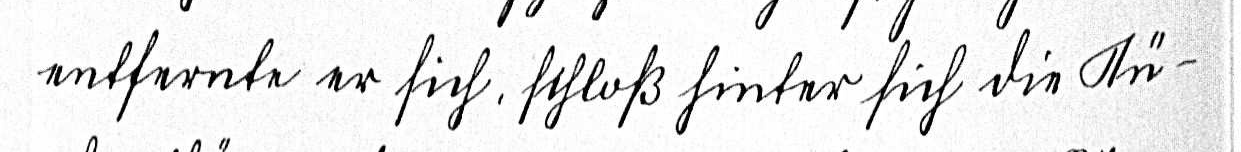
entfernte er sich, schloß hinter sich die Kü¬
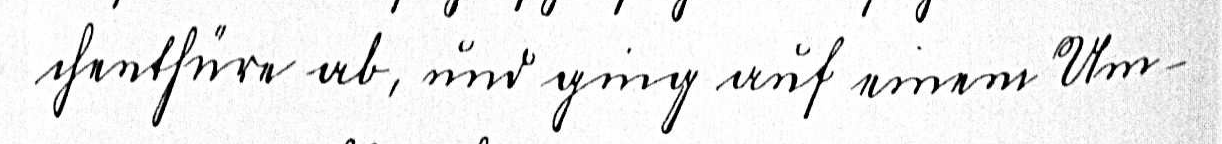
stenthüre ab, und ging auf einem Um¬
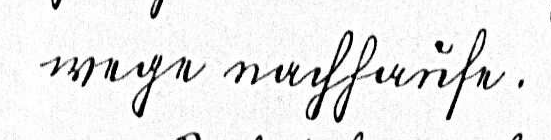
wege nachhause.
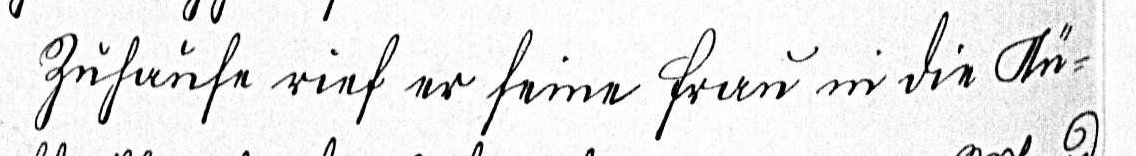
Zuhause rief er seine Frau in die Kü¬
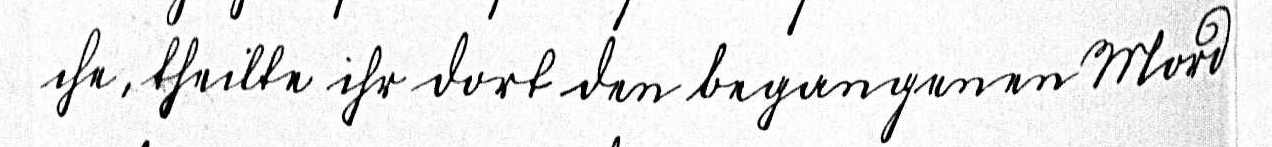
che, theilte ihr dort den begangenen Mord
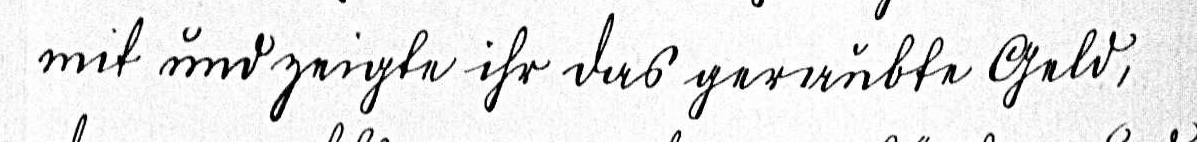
mit und zeigte ihr das geraubte Geld,
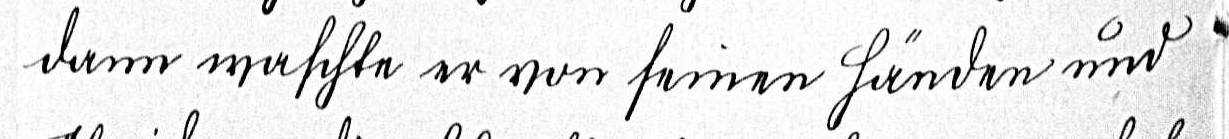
dann waschte er von seinen Händen und
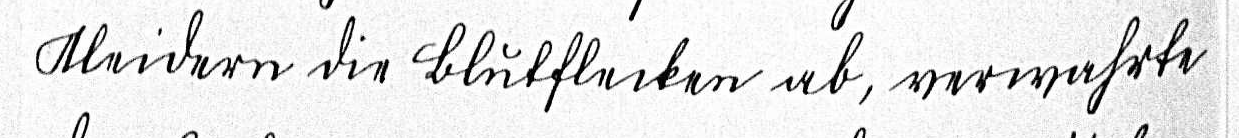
Kleidern die Blutflecken ab, verwahrte
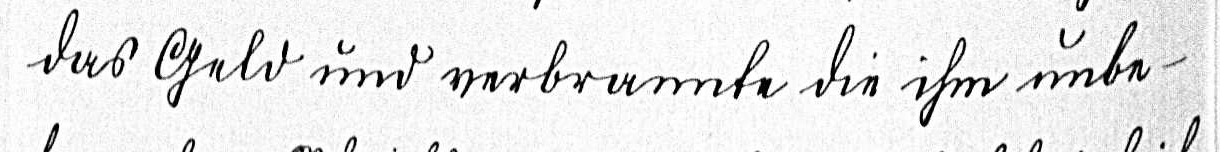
das Geld und verbrannte die ihm unbe¬
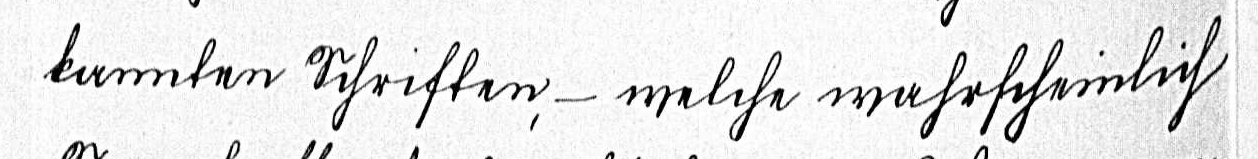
kannten Schriften, – welche wahrscheinlich
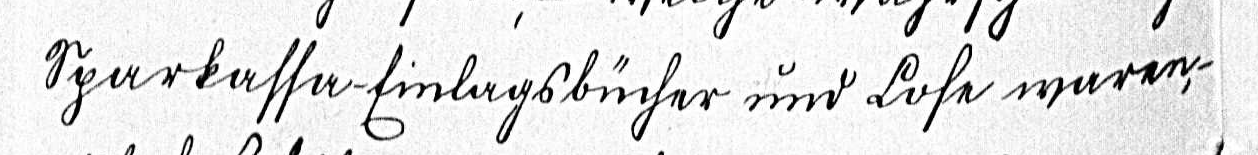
Sparkassa-Einlagsbücher und Lose waren, –
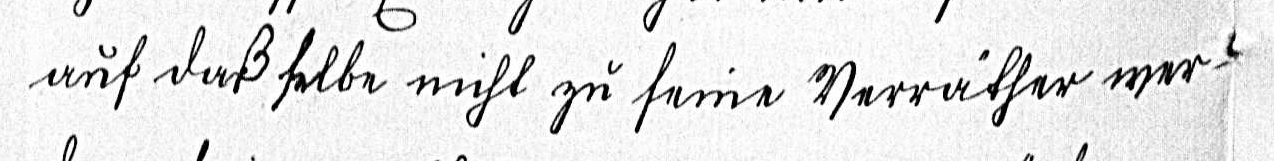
auf daß selbe nicht zu seine Verräther wer¬
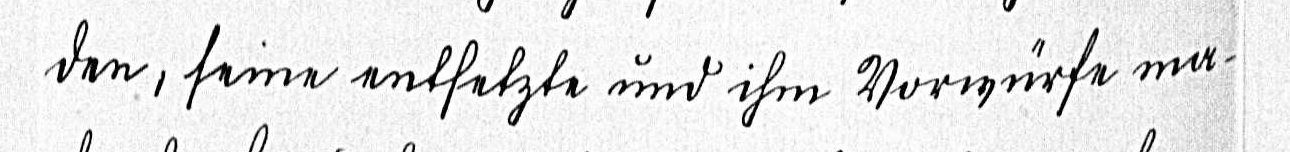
den, seine entsetzte und ihm Vorwürfe ma¬
